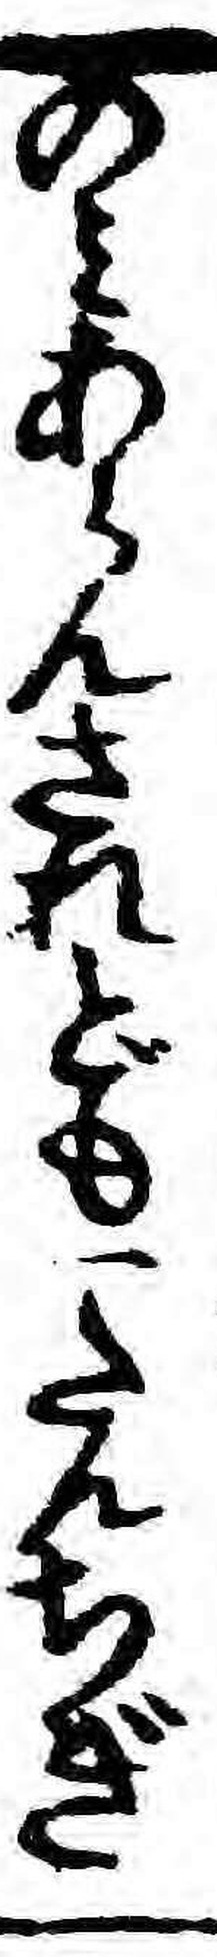のみあらんされども一たんちぎ
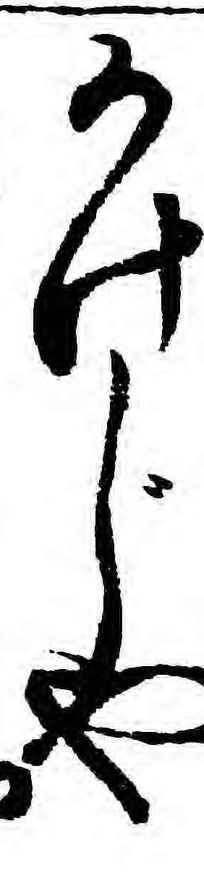かけじや
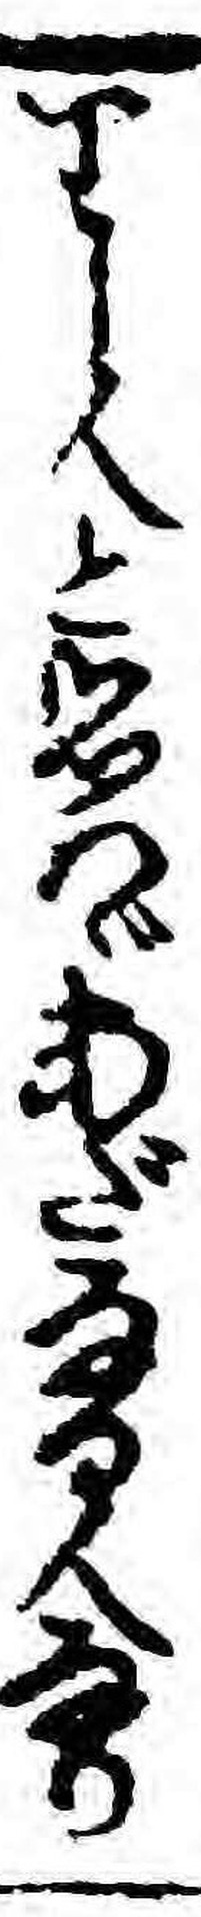りし人と思はゞあだなる人なり
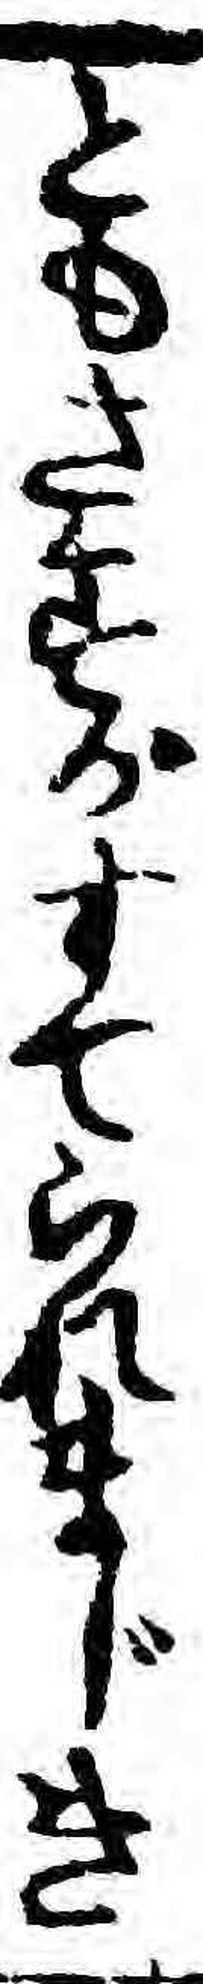ともさすがすてられまじき
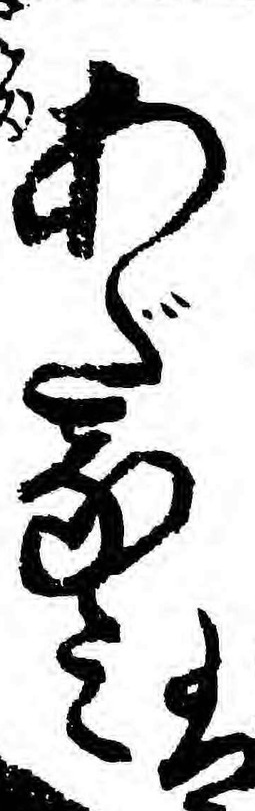あだなみ
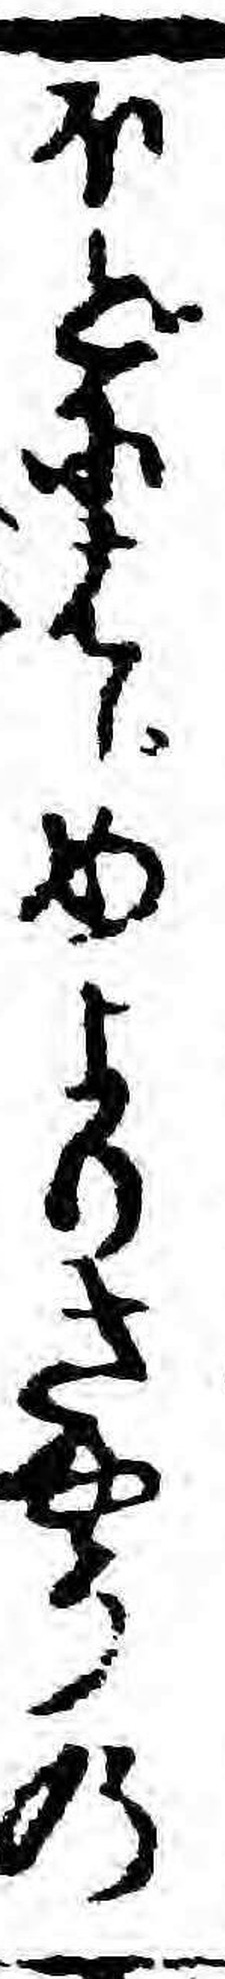ほどにはじめよりさやうの
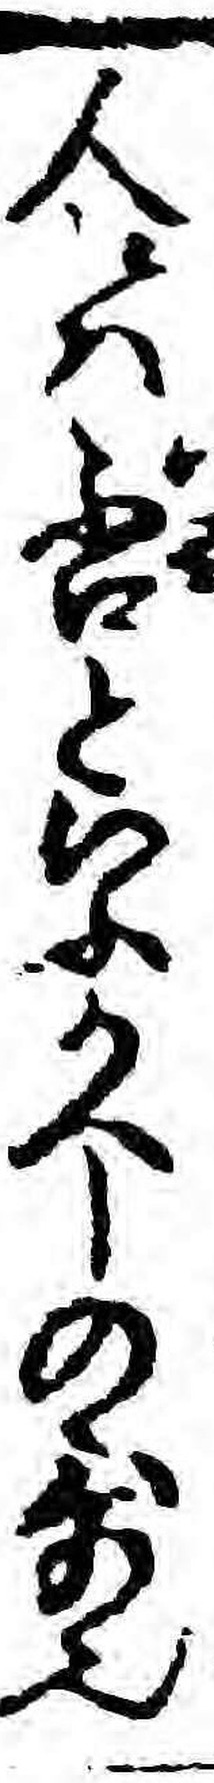人には否といふかへしの哥也
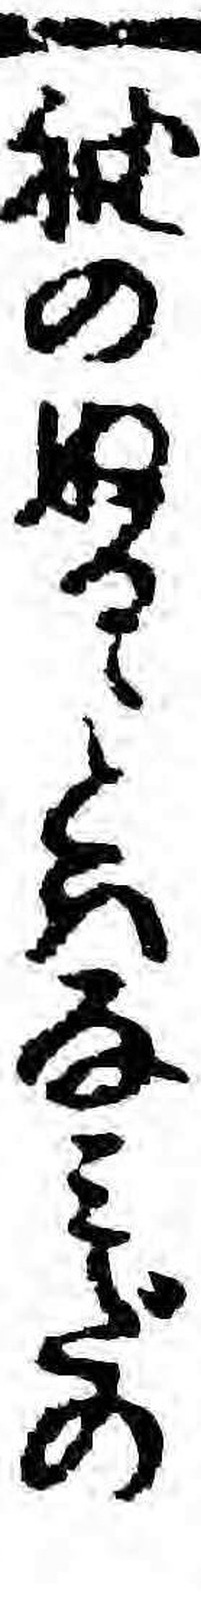袖のぬるゝとはなみだの
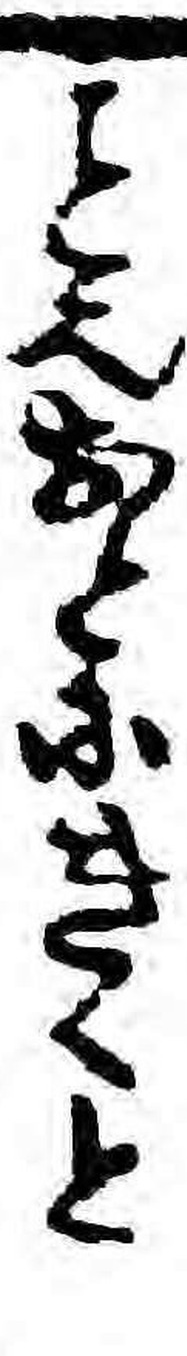こと也おとにきくと
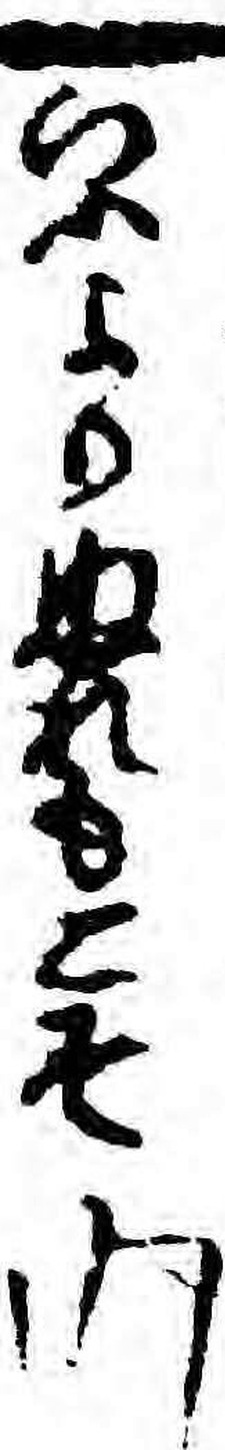いふよりぬれもこそ
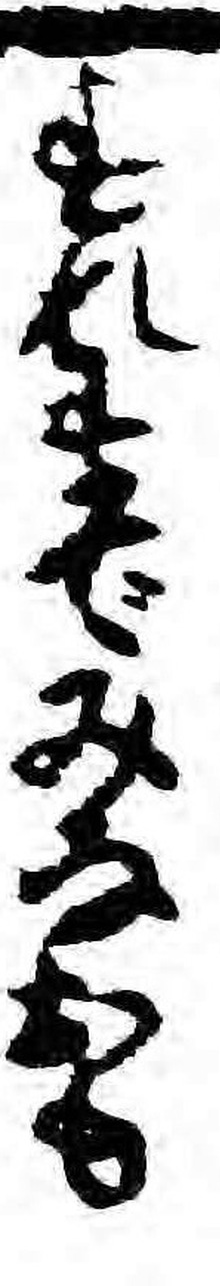すれまでみなおも
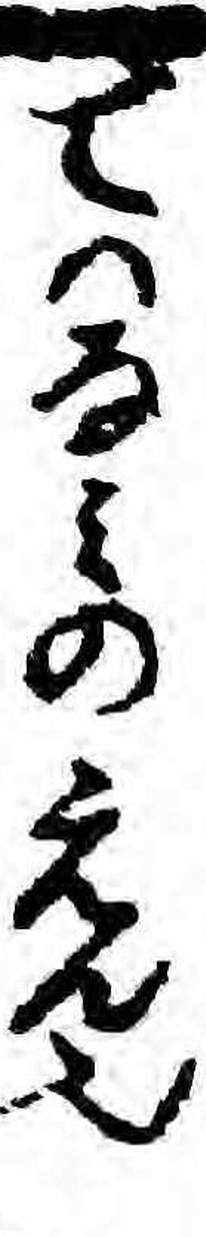てはなみのえん也
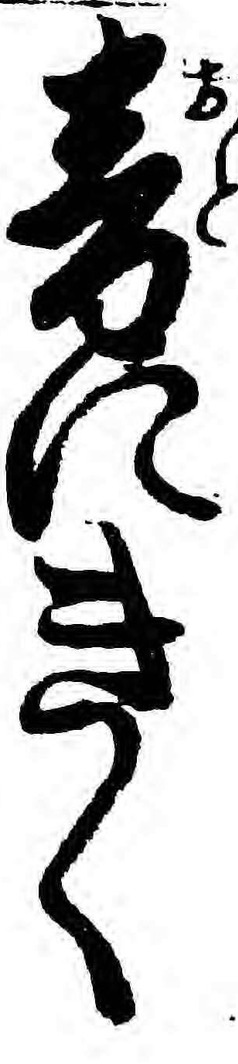音にきく
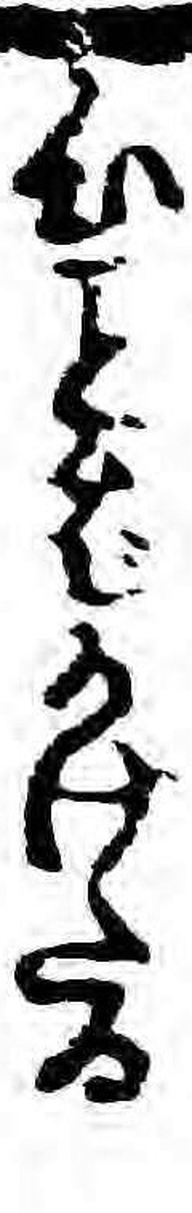心ことばかけたる
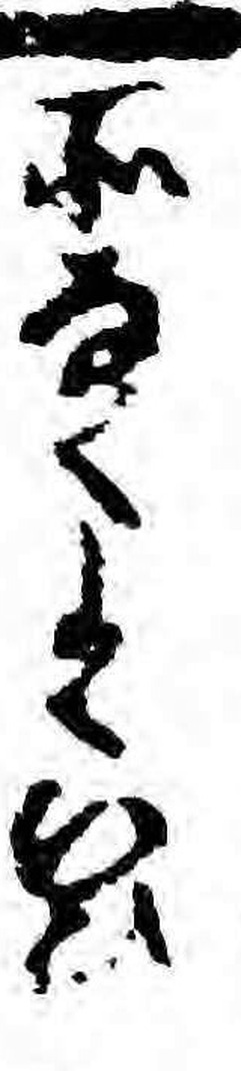所なくよくいひ
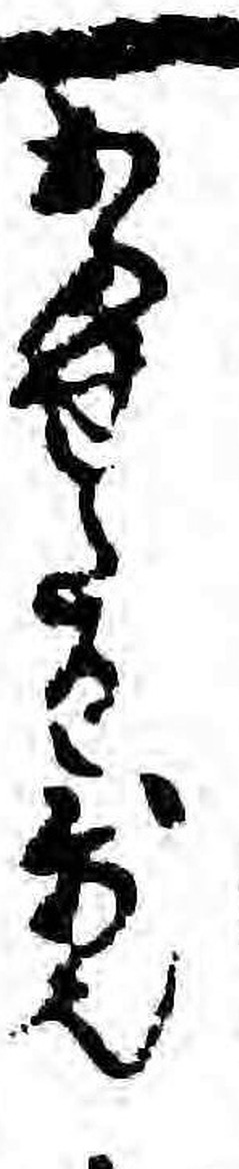あふせたるゝ哥也
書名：頭書和歌注譯／壽賀多百人一首小倉錦
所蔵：国文学研究資料館
